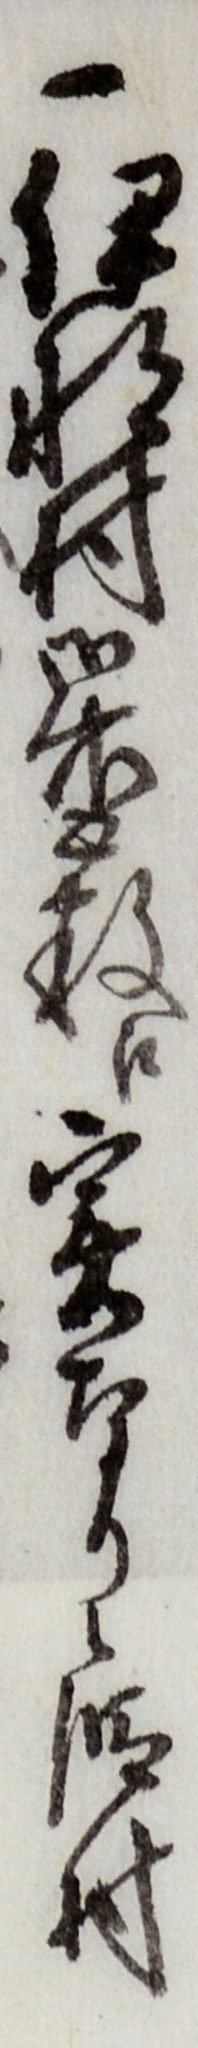一伊那村御竹薮江実なり候段村
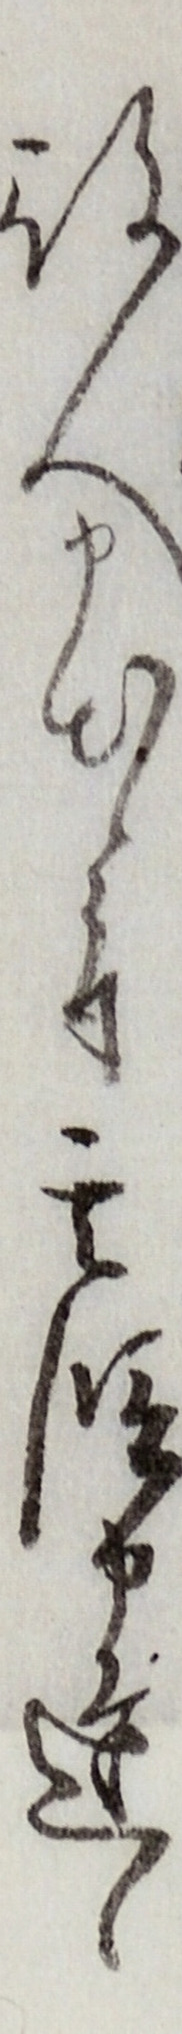役人申出候ニ付其段申達候
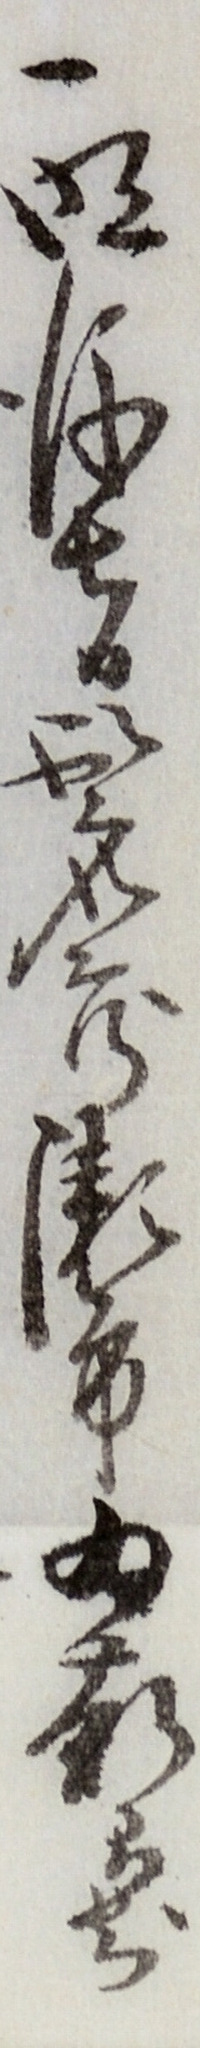一明後七日麗蔵瀬市為薪間知
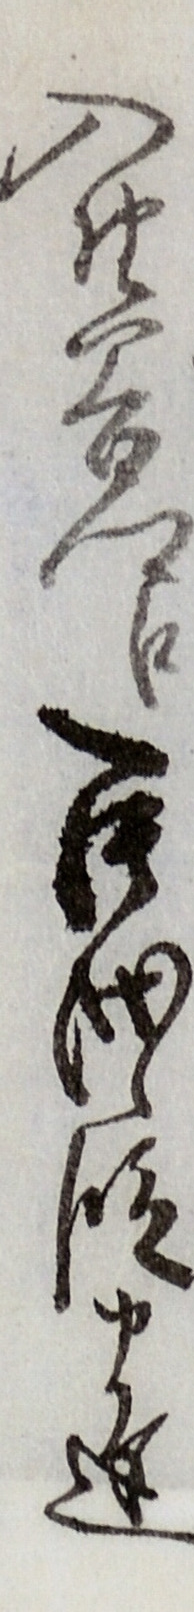入野谷郷江罷越候段申達
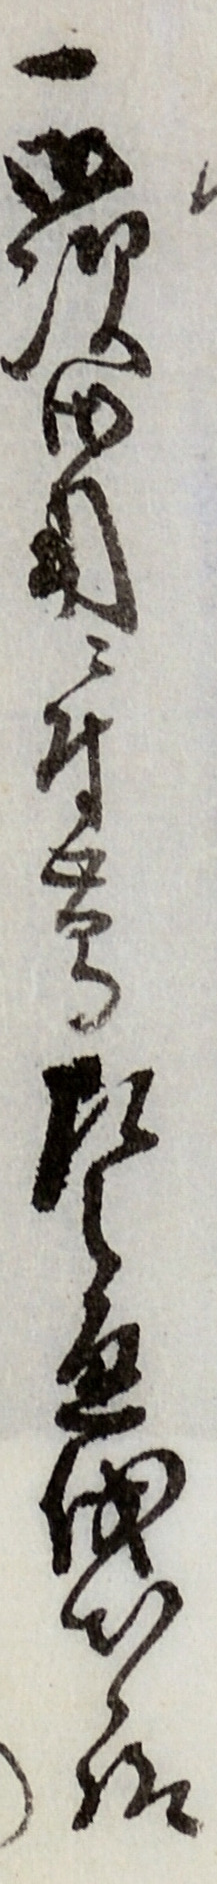一御次御用ニ付蔦左之通伐出候様
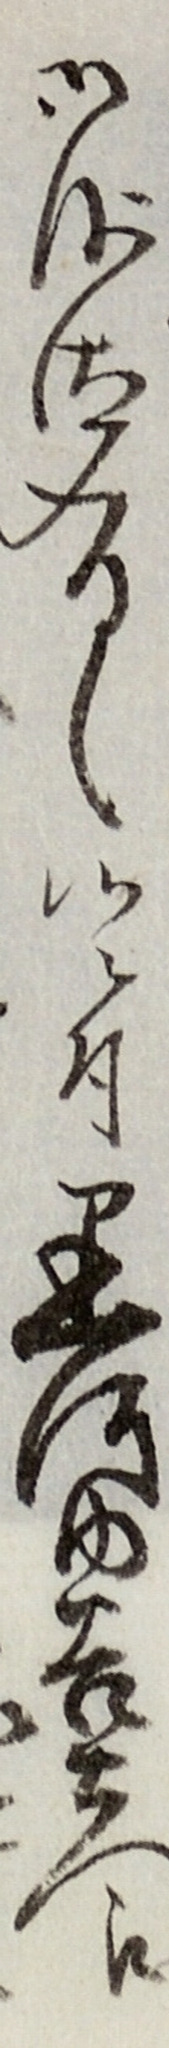御沙汰有之候ニ付黒河内谷右衛門江
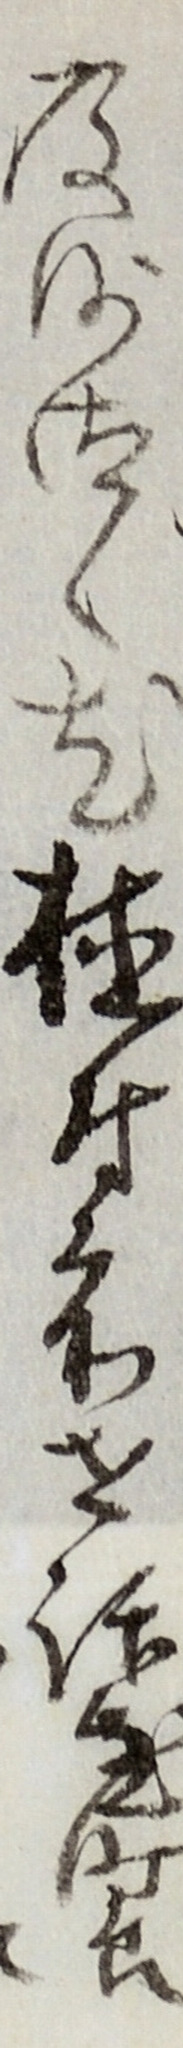及沙汰候尤植付前世話致
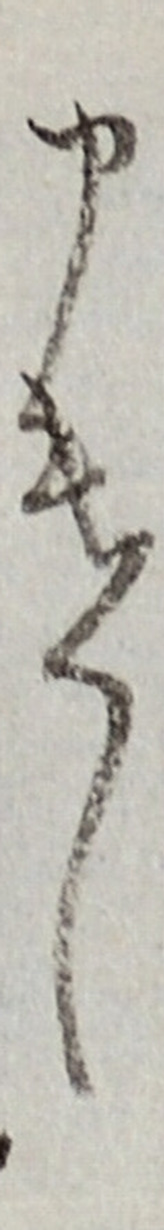申遣候
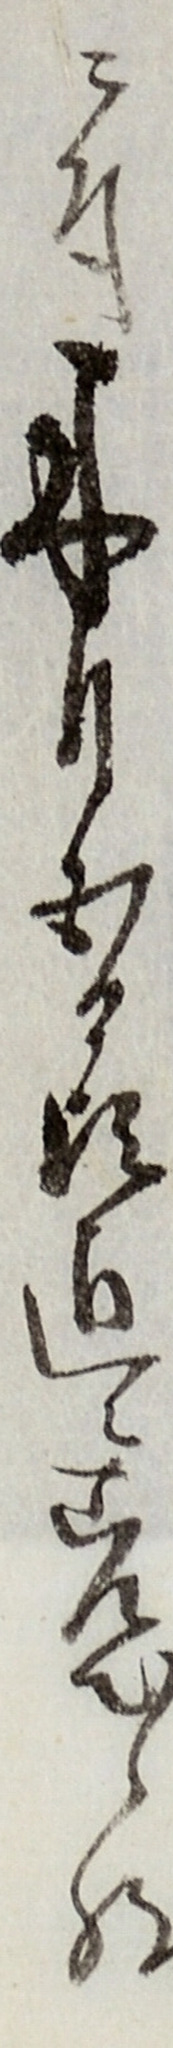ニ付来月五日頃迄ニ差出候様
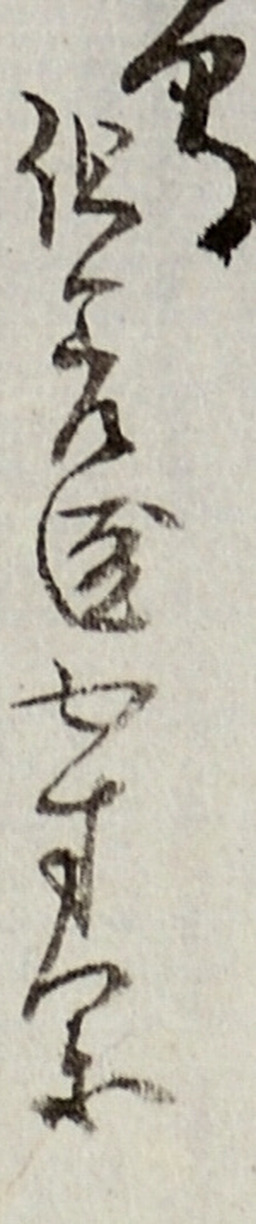但差渡五寸余
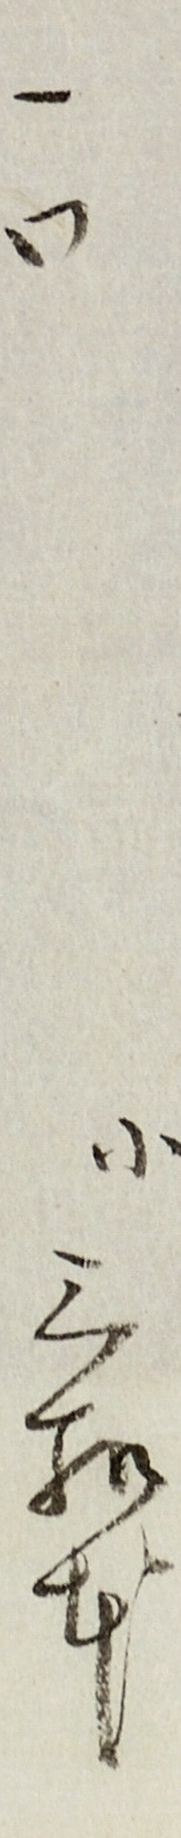一同小三拾本
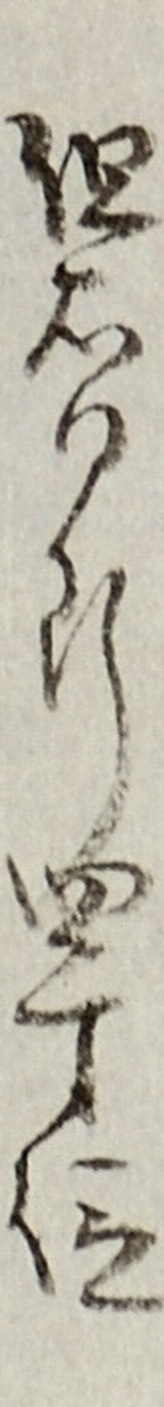但右同断四寸位
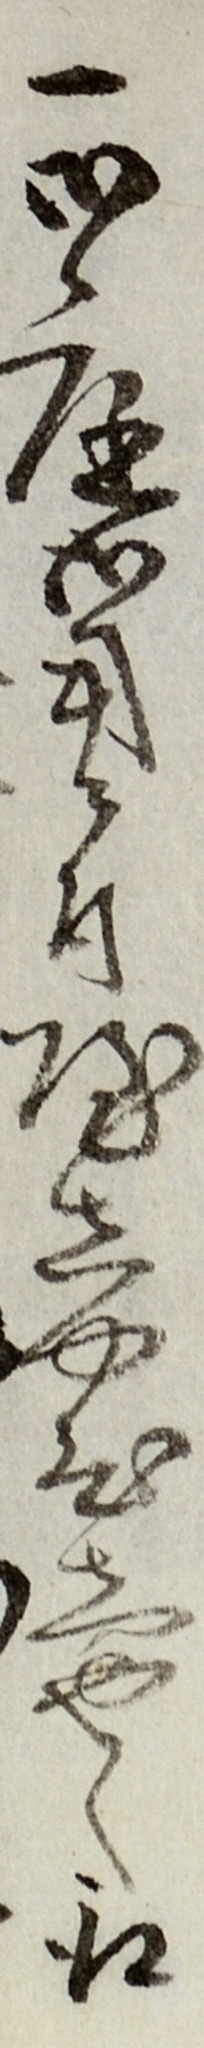一御庭御用ニ付やしやひしやく取
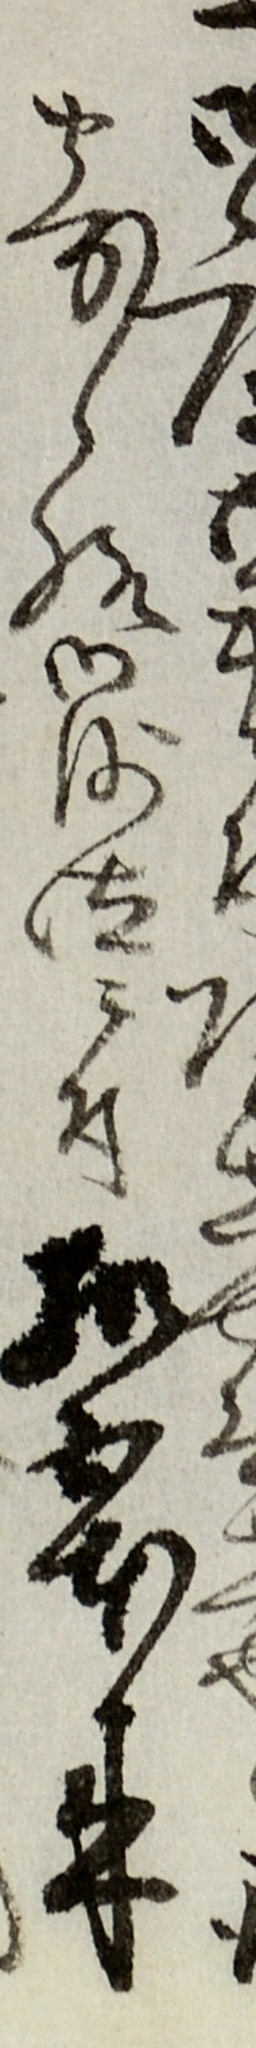寄候様御沙汰ニ付拾五本来
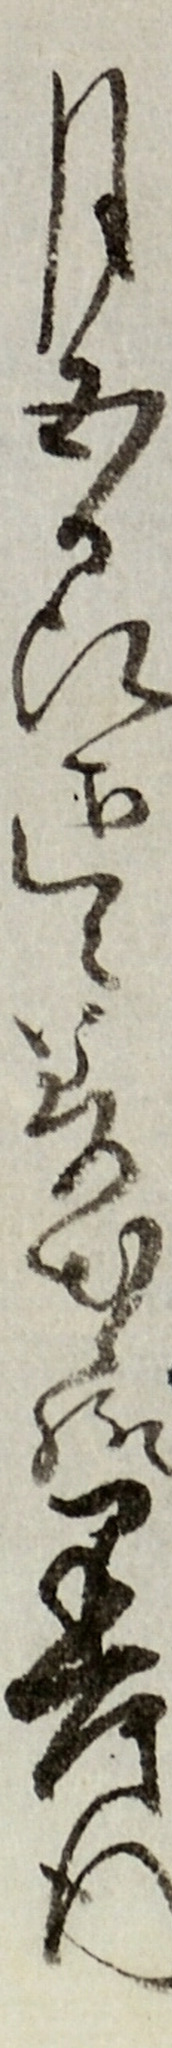月五日頃迄ニ差出候様黒河内
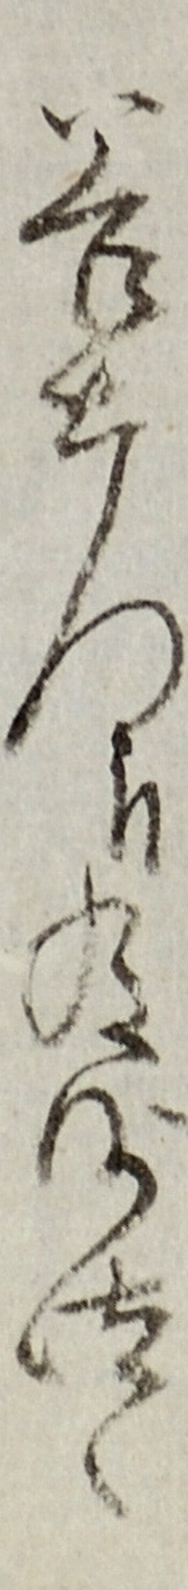谷右衛門江及沙汰候
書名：御山方御薪方諸事御用留
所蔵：伊那市立高遠町図書館・合同会社AMANE
